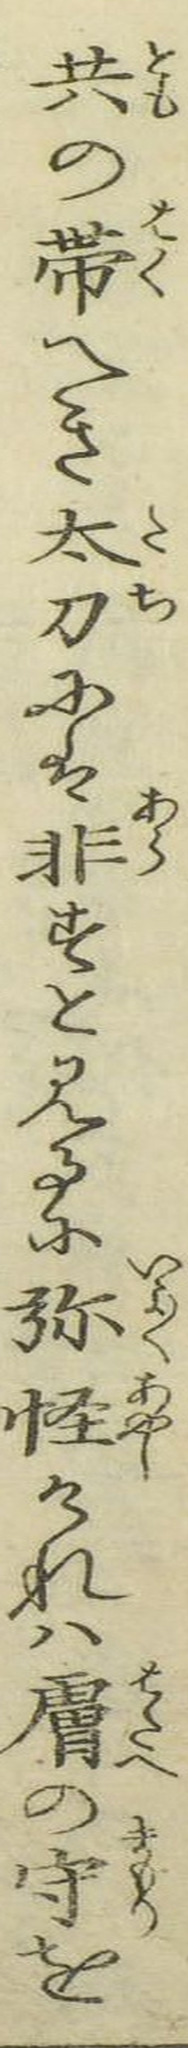共の帯へき太刀には非すと見るに弥怪けれは膚の守を
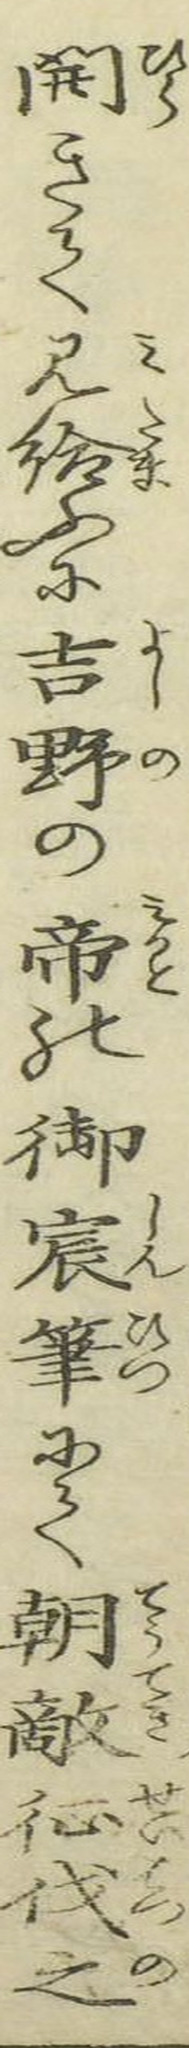開きて見給ふに吉野の帝の御宸筆にて朝敵征伐之
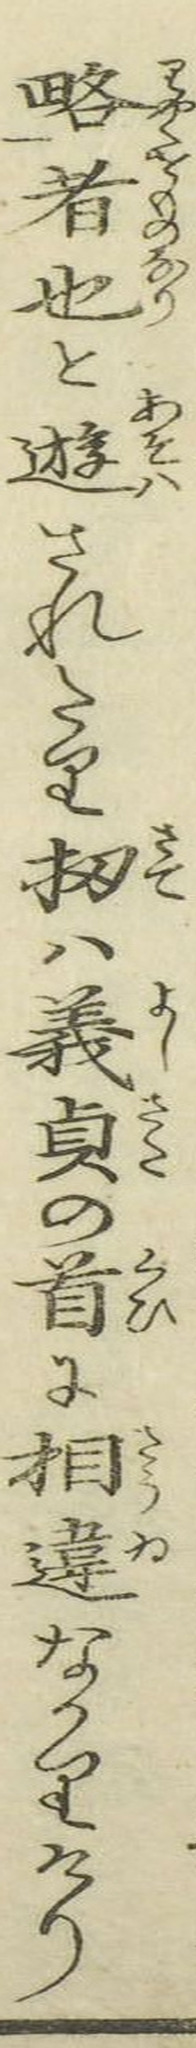略者也と遊されたり扨は義貞の首に相違なかりけり
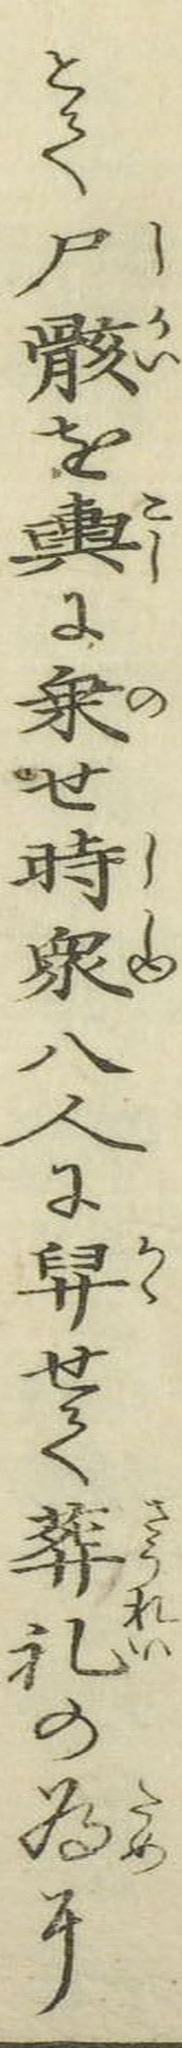とて尸骸を輿に乗せ時衆八人に舁せて葬礼の為に
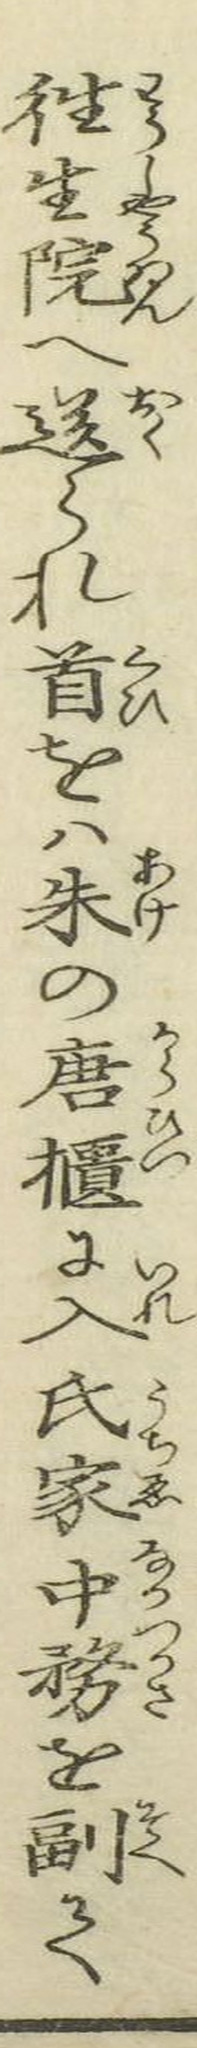往生院へ送られ首をは朱の唐櫃に入氏家中務を副て
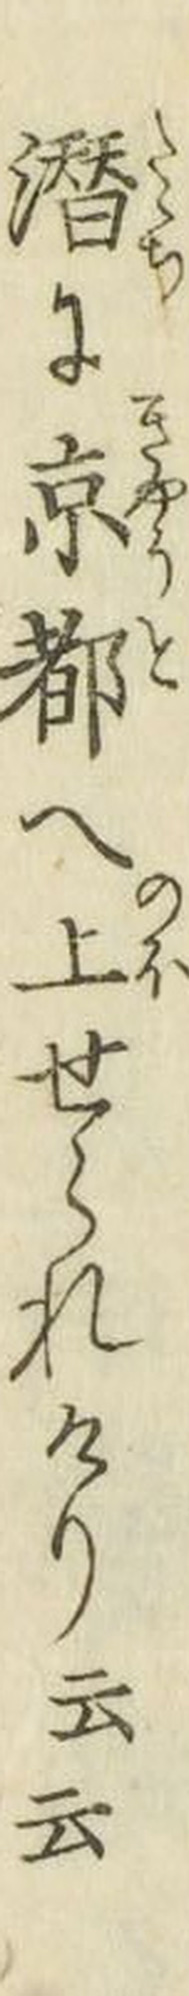潜に京都へ上せられけり云云
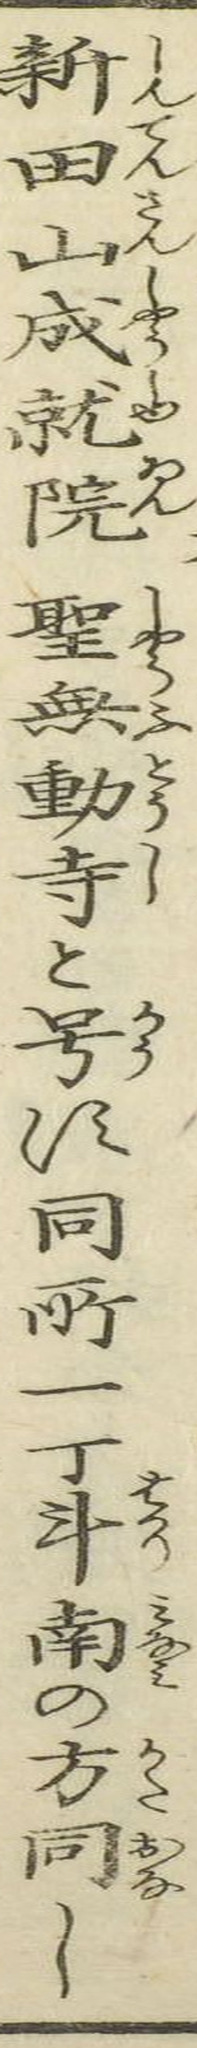新田山成就院聖不動寺と号す同所一丁斗南の方同し
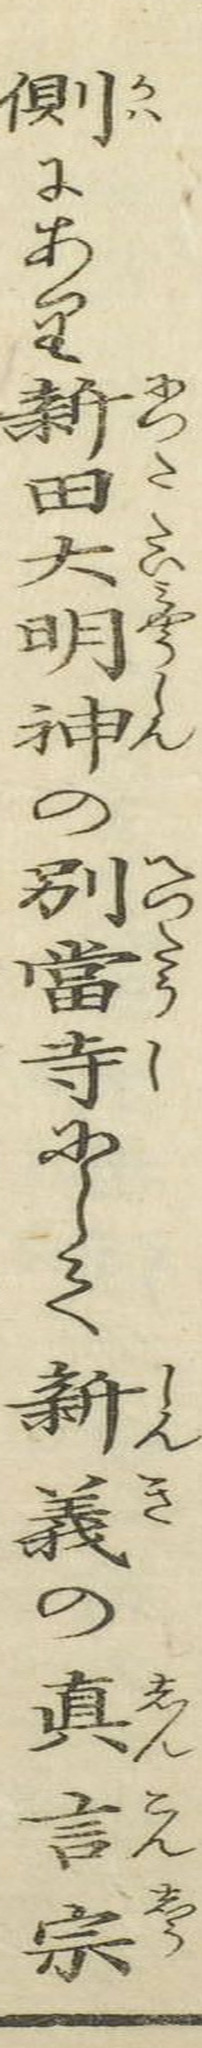側にあり新田大明神の別當寺にして新義の真言宗
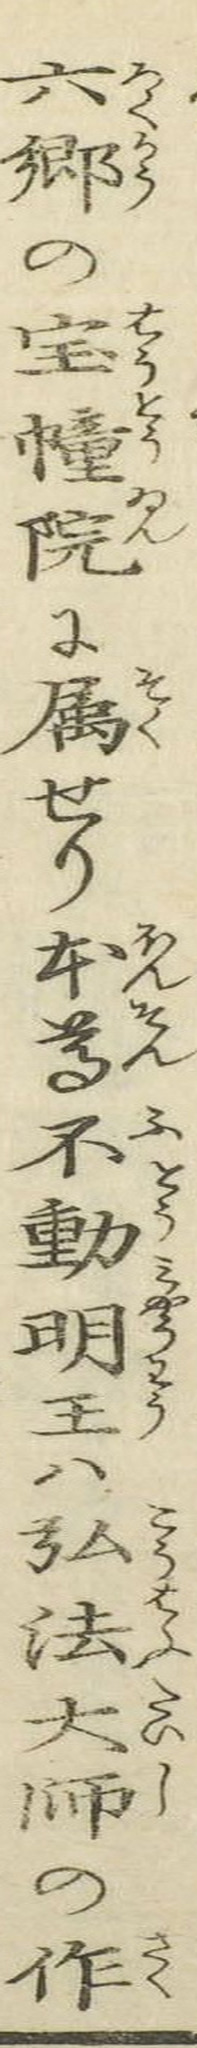六郷の宝幢院に属せり本尊不動明王は弘法大師の作
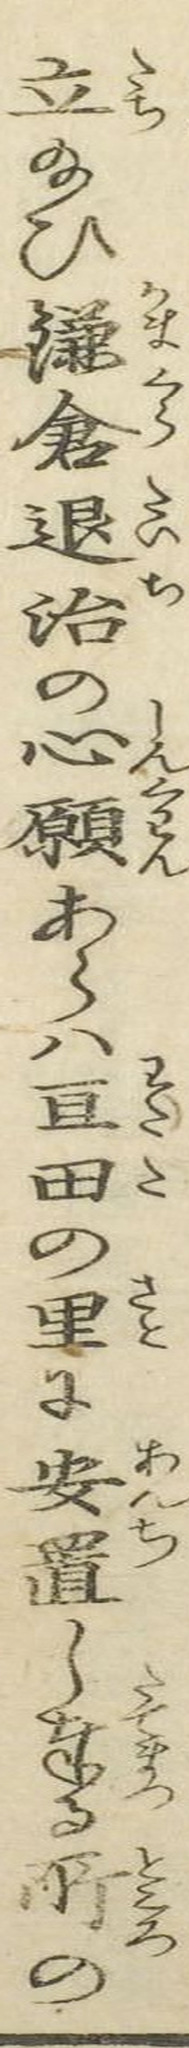立給ひ鎌倉退治の心願あらは亘田の里に安置し奉る所の
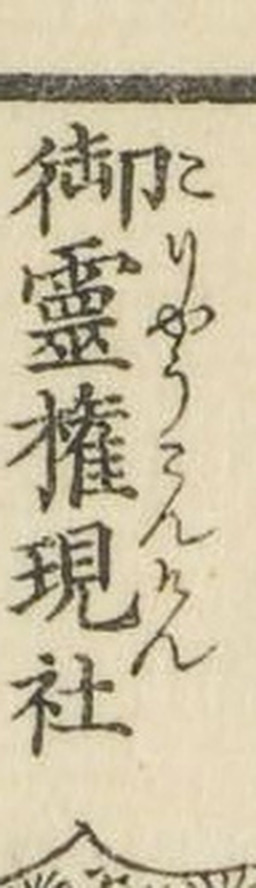御霊権現社
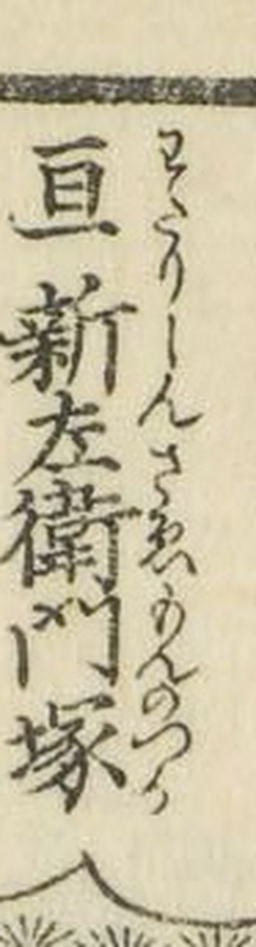亘新左衛門塚

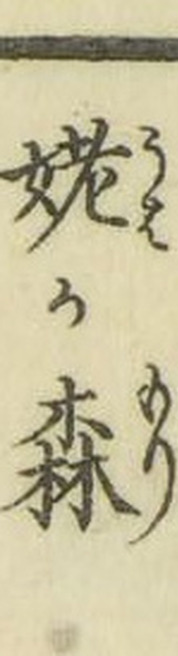姥ゕ森
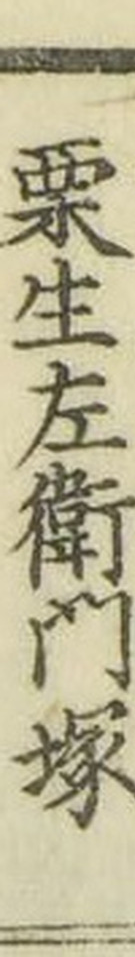栗生左衛門塚
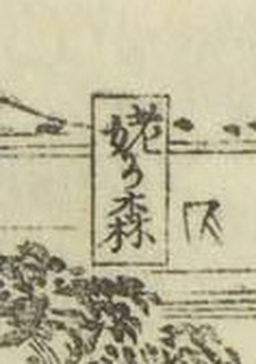姥ゕ森
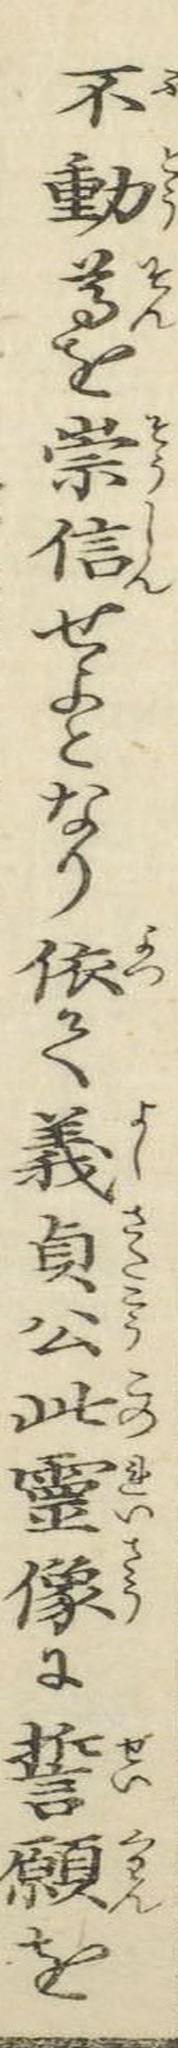不動尊を崇信せよとなり依て義貞公此霊像に誓願を
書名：江戸名所図会 20巻 巻之5
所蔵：東京学芸大学教育コンテンツアーカイブ
